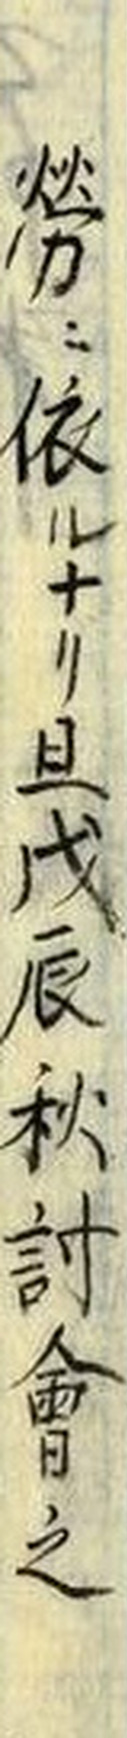労ニ依ルナリ且戊辰秋討会之
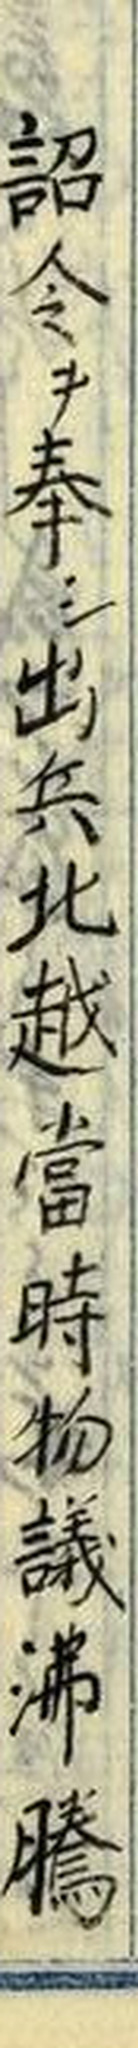詔令ヲ奉シ出兵北越当時物議沸騰
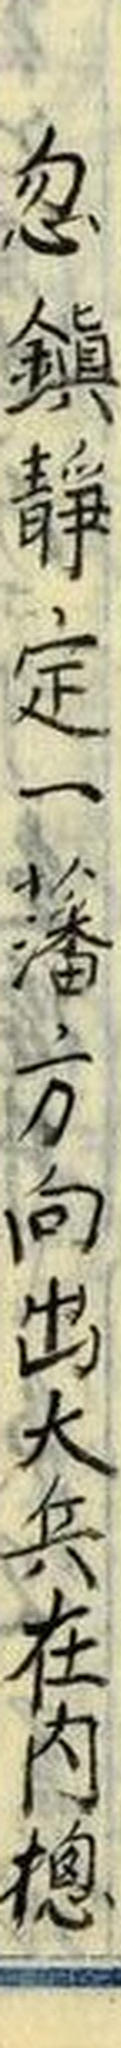忽鎮静定一藩方向出大兵在内総
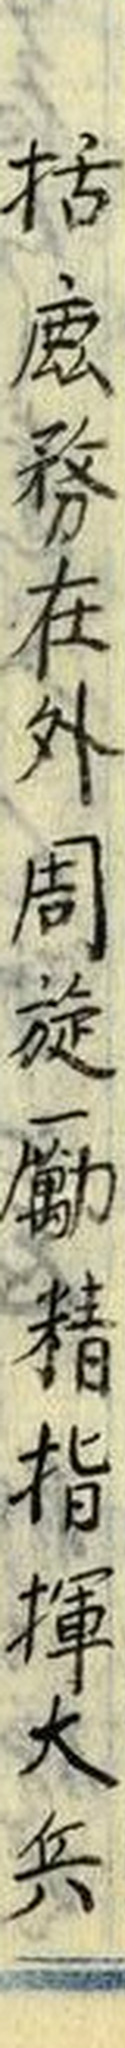括庶務在外周旋励耤指揮大兵
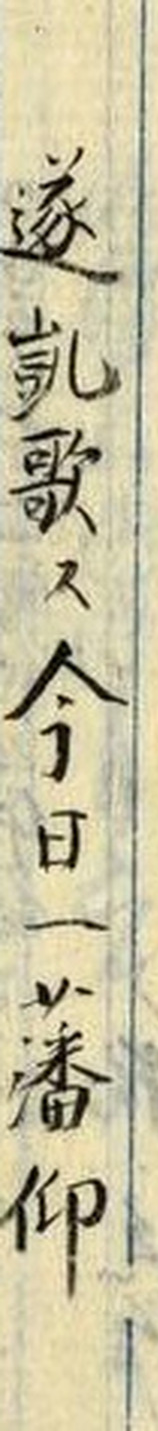遂凱歌ス今日一藩仰
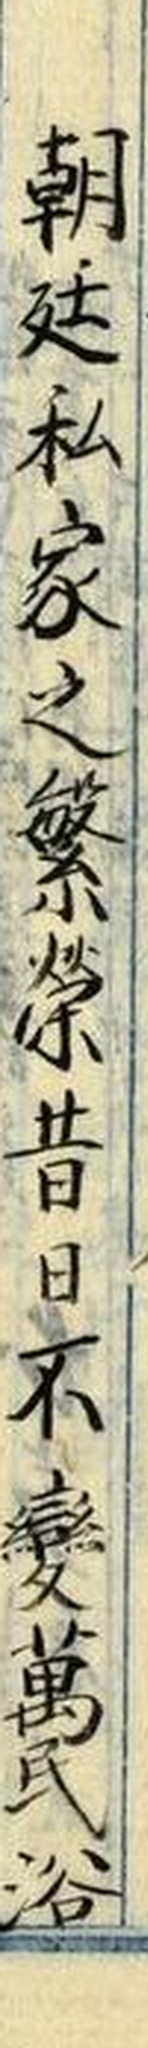朝廷私家之繁栄昔日不変万民浴
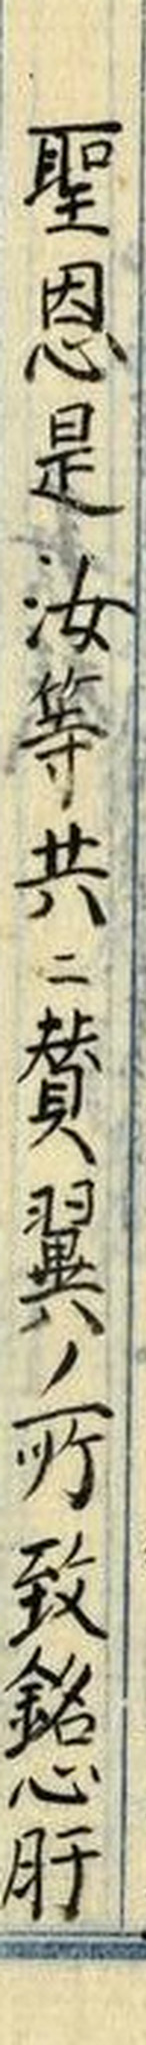聖恩是汝等共ニ賛翼ノ所致銘心肝
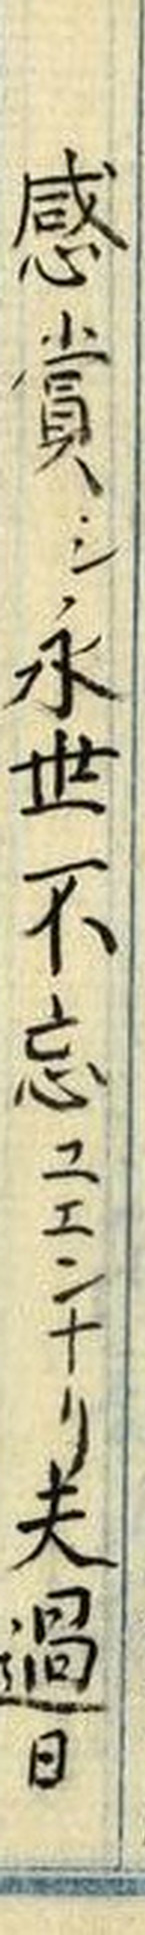感賞シ永世不忘ユエンナリ夫過日
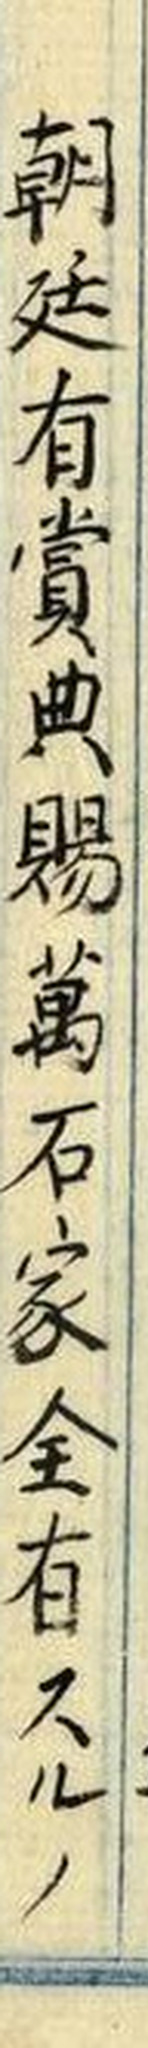朝廷有賞典賜万石家全有スルノ
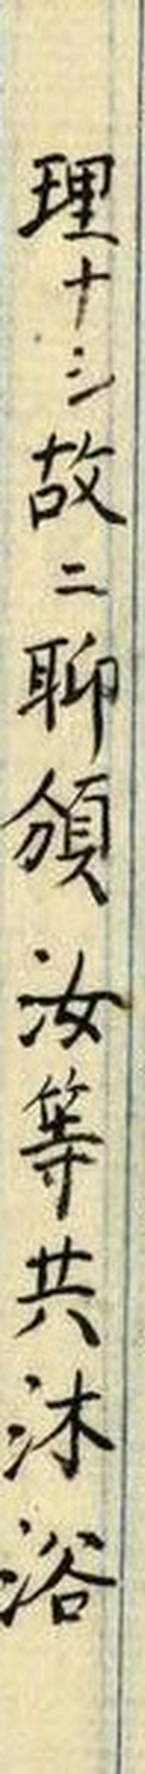理ナシ故ニ聊頒汝等共沐浴
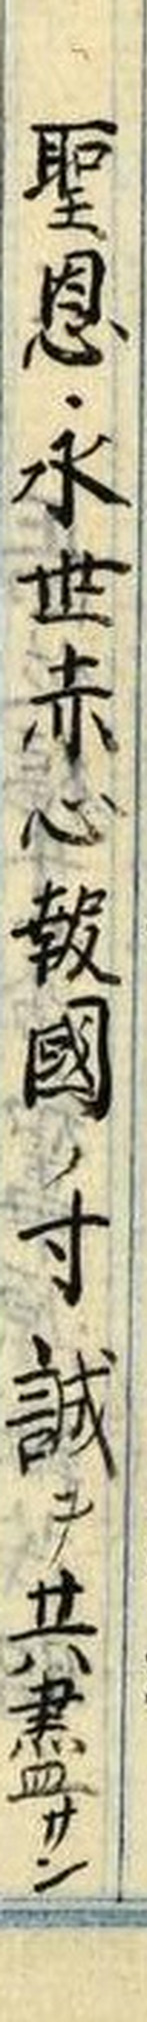聖恩永世赤心報国ノ寸誠ヲ共盡サン
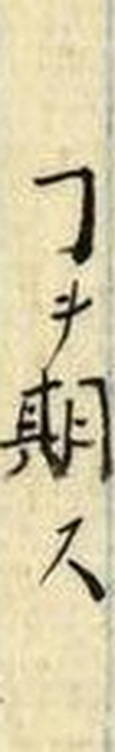事ヲ期ス
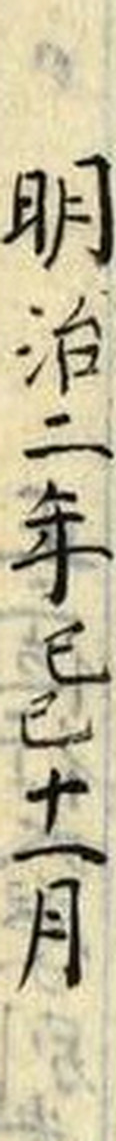明治二年己巳十一月

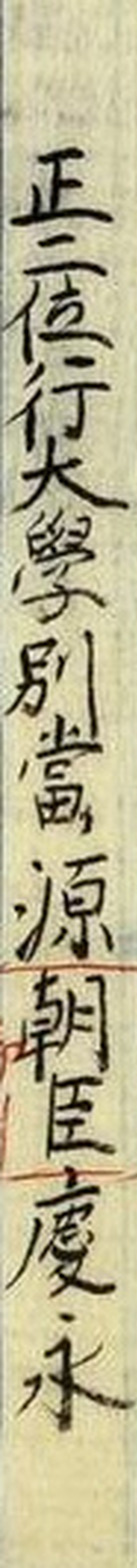正二位行大学別当源朝臣慶永(角印)
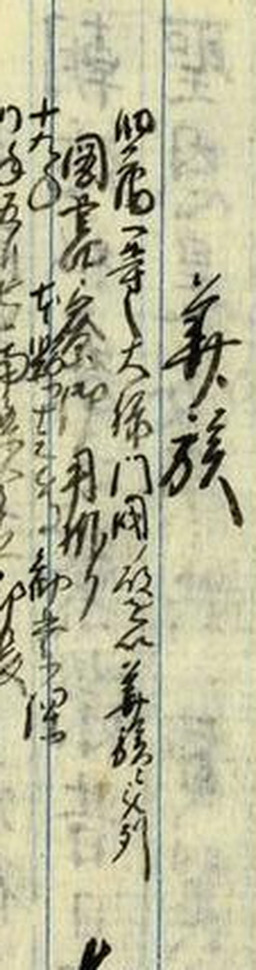旧藩一等之大禄門閥ノ故を以華族ニ被列
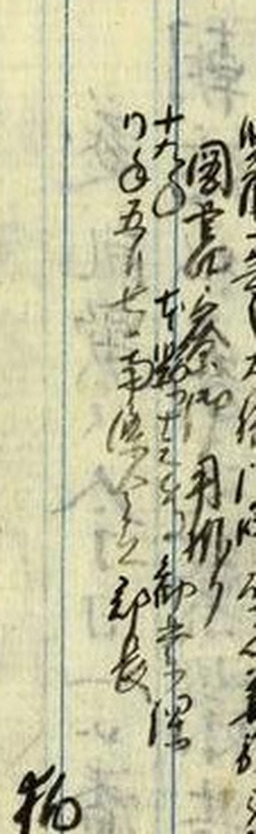同年五月七日南条部長
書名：温古集 三巻
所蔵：福井県文書館 Fukui Prefectural Archives
